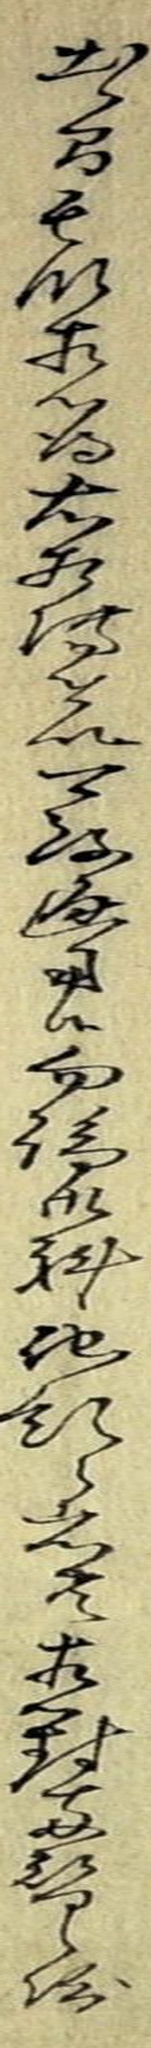出候間其段相心得右相場を以可致通用候勿論御料他領之者共相対両替之儀
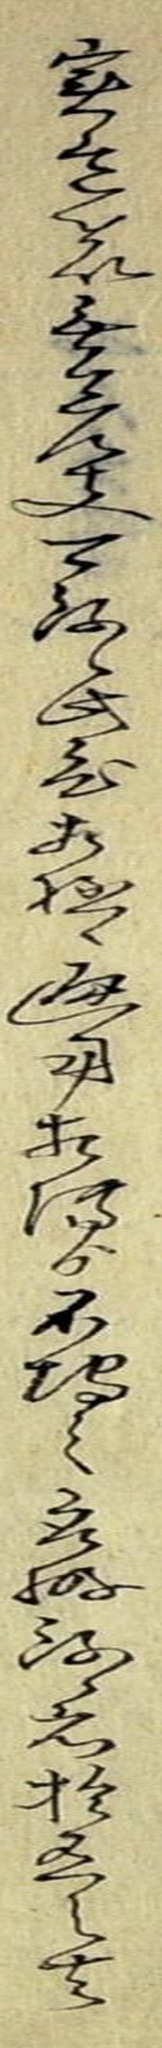実意を以無差支可致候此度相極候通用相場ゟ不埒之取扱致候者於有之は
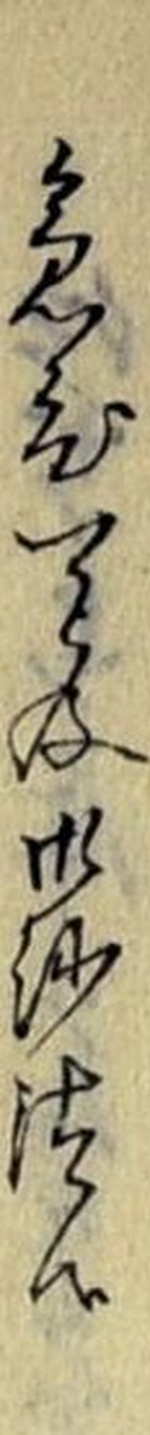急度可被及御沙汰候
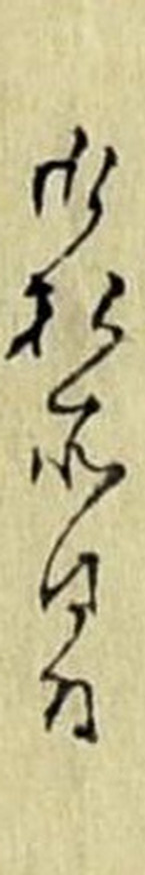御札所目付
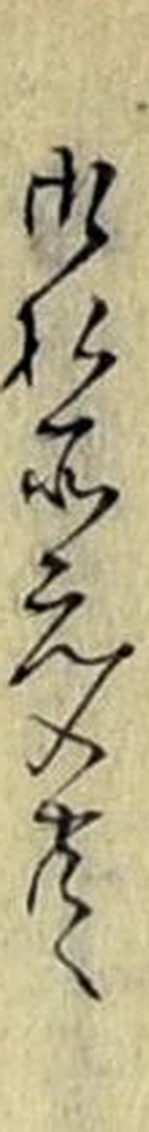御札所元〆共へ
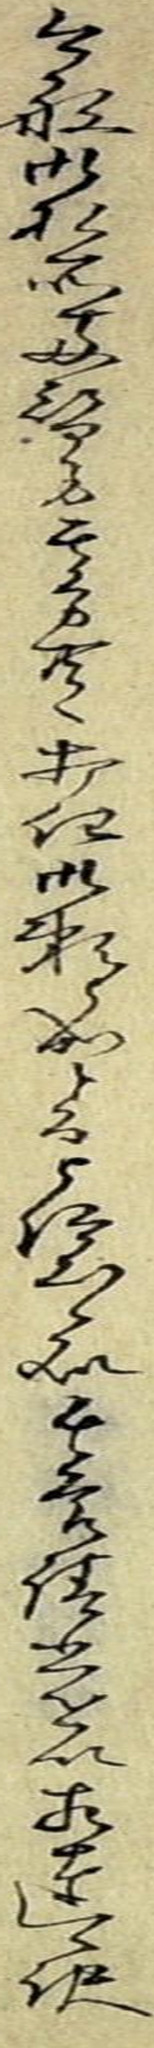○今般御札所両替方其方共へ相任御頼被成度仰出候処其節請書を以相達候訳
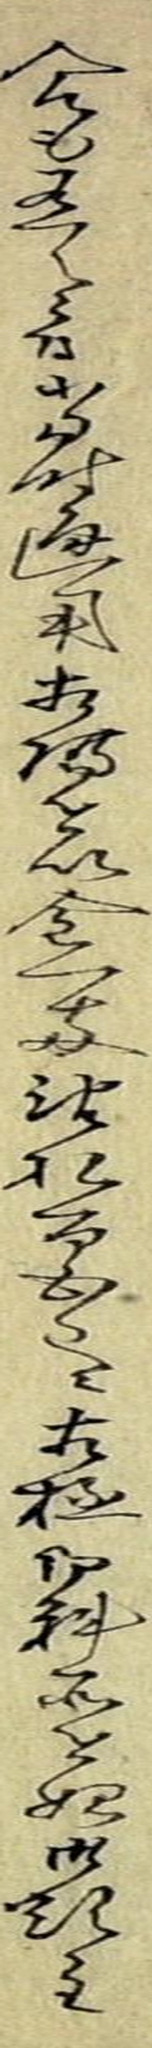合も有之候に付当時通用相場を以金一両銀札百五匁に相極御料所を始御領主
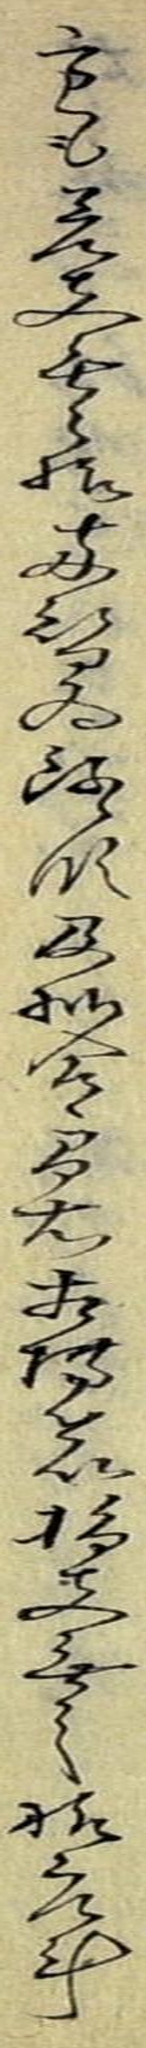方へも差支無之様両替為致候段及掛合候間右相場を以指支無之様取斗
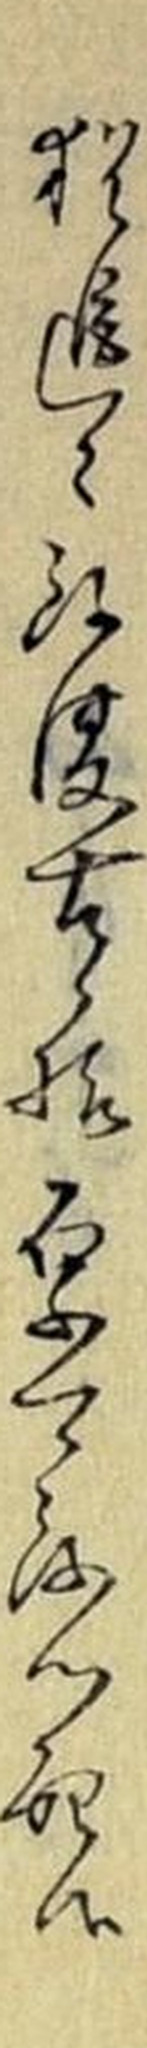猶追々致復古候様厚可被致心配候
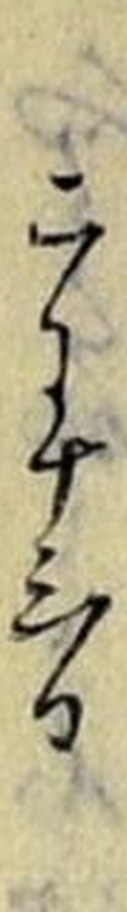二月十三日
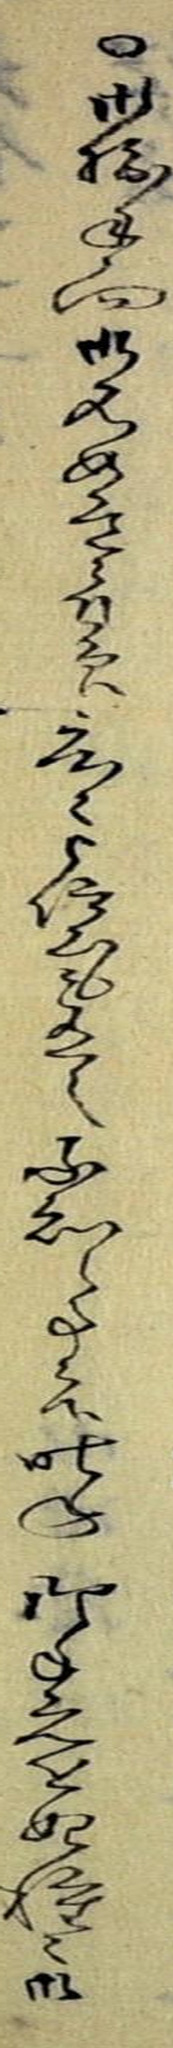○御勝手向御不如意に付而は度々被仰出候も有之承知之事に候昨年御手元を始種々御
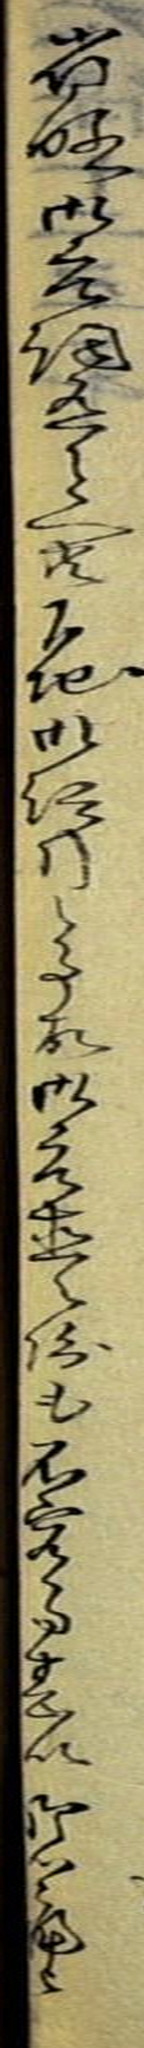省略御取調有之候へ共下地御跡引之事故御取直之儀も不定事甚以御心痛被
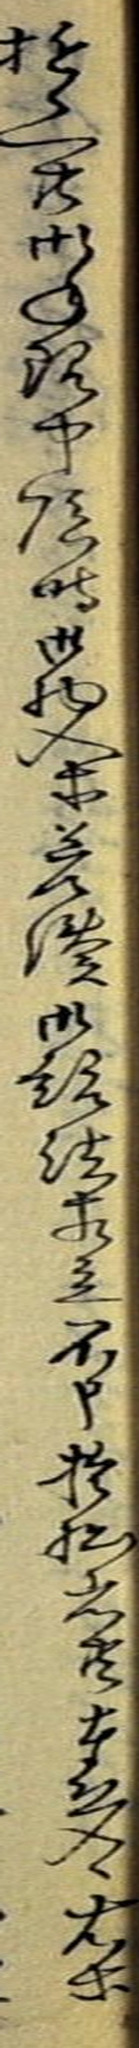遊候へ共御年限中臨時御物入等差湊御趣法相立不申於拙者共奉恐入候右等
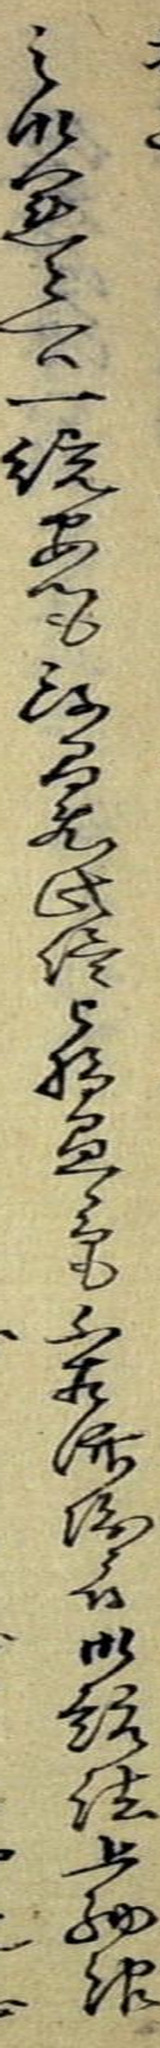之御運に候へは一統安心も致間敷此侭被指置候而も不相済に付御趣法上納銀
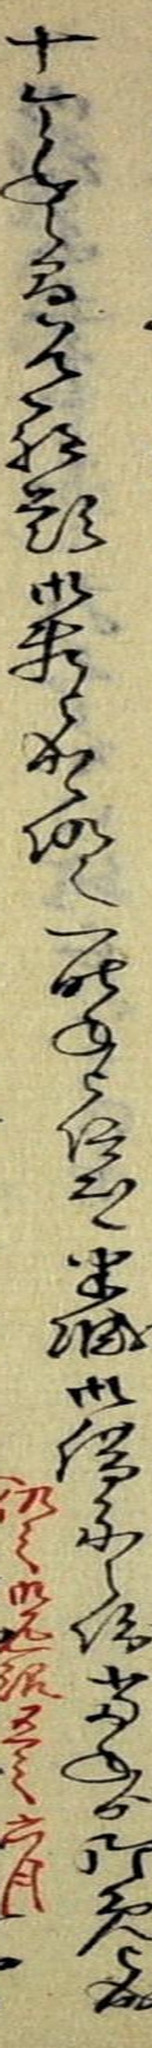十ヶ年之間乍難題御頼被成候仍之一昨年被仰出候候半減御借米之儀当年ゟ御免被成
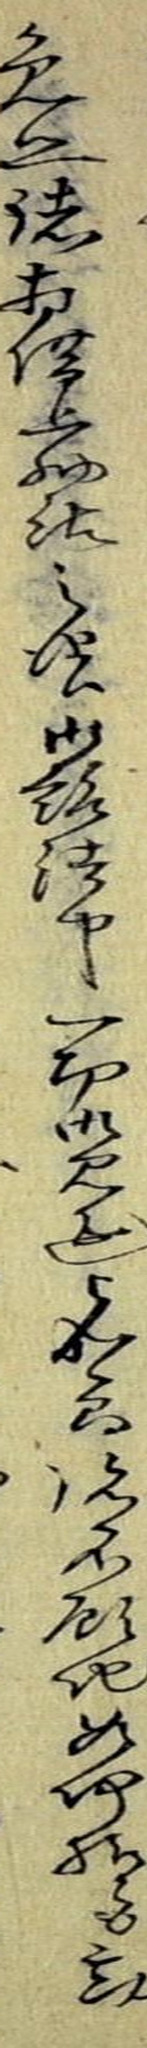免之上諸拝借上納銀之儀は御趣法中一切御見延被成候間弥不顧他如何様にも勘
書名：命令之部 六
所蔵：福井県文書館 Fukui Prefectural Archives
